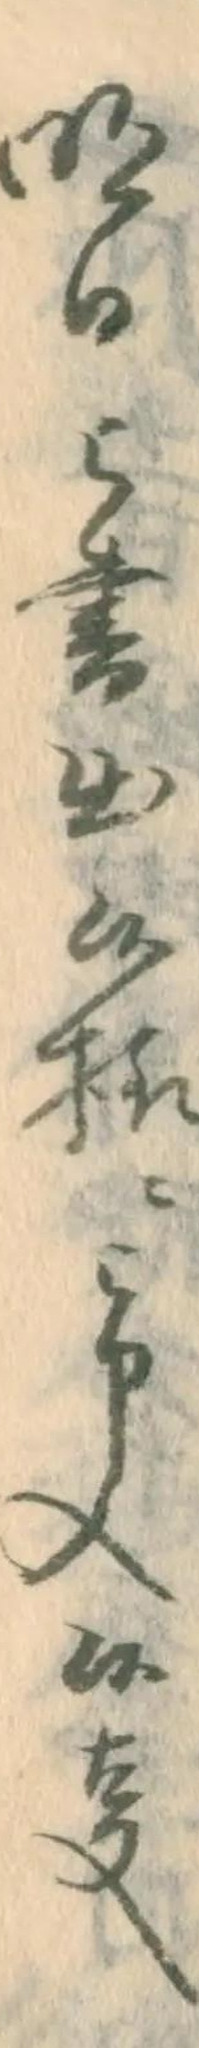明日被書出候様ニ被申入候事

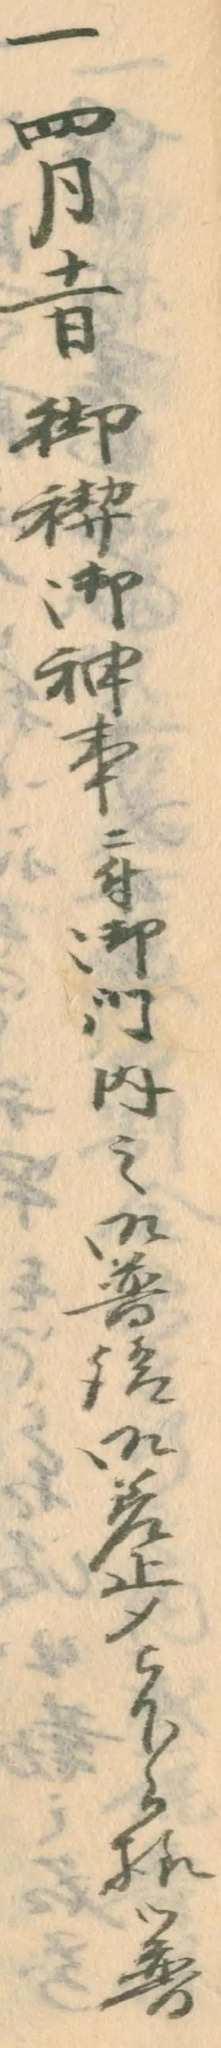一四月十一日御禊御神事ニ付御門内之御普請御差止メ被下候様御普
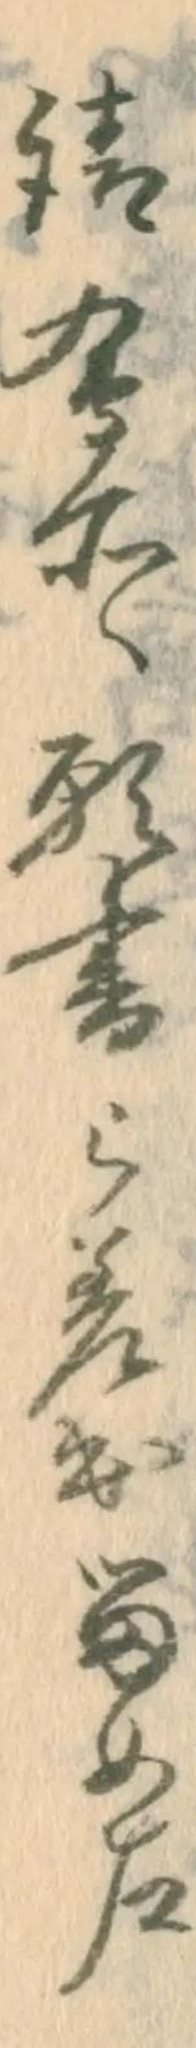請会所へ願書被差出留如左
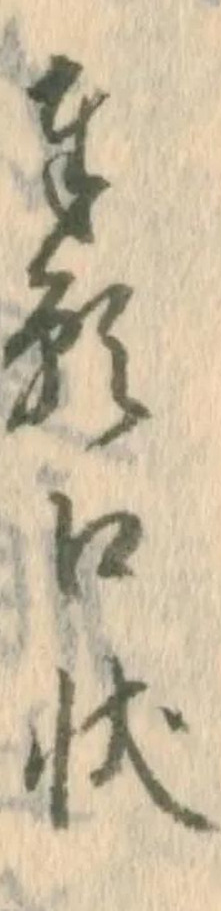奉願口状
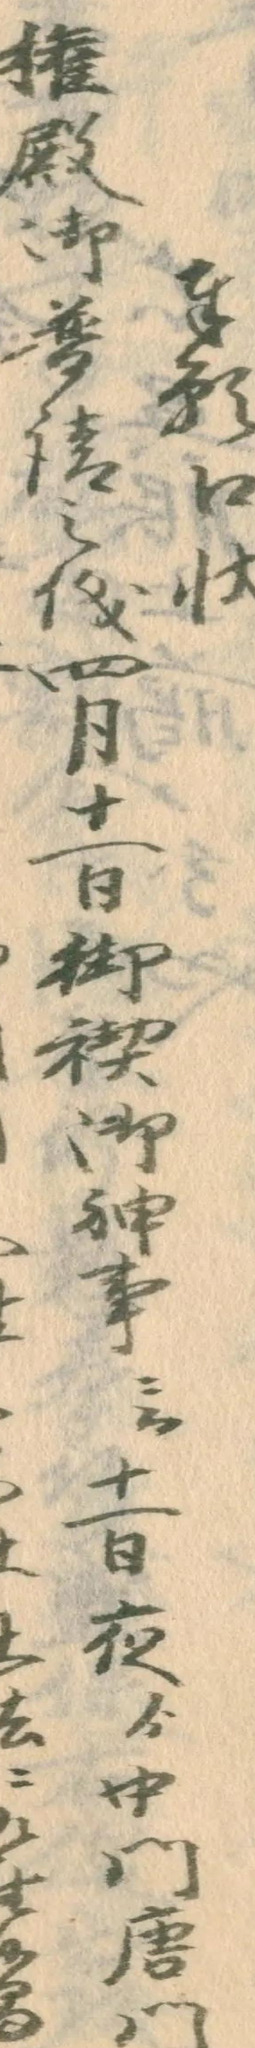権殿御普請之儀四月十一日御禊御神事ニ而十一日夜ゟ中門唐門
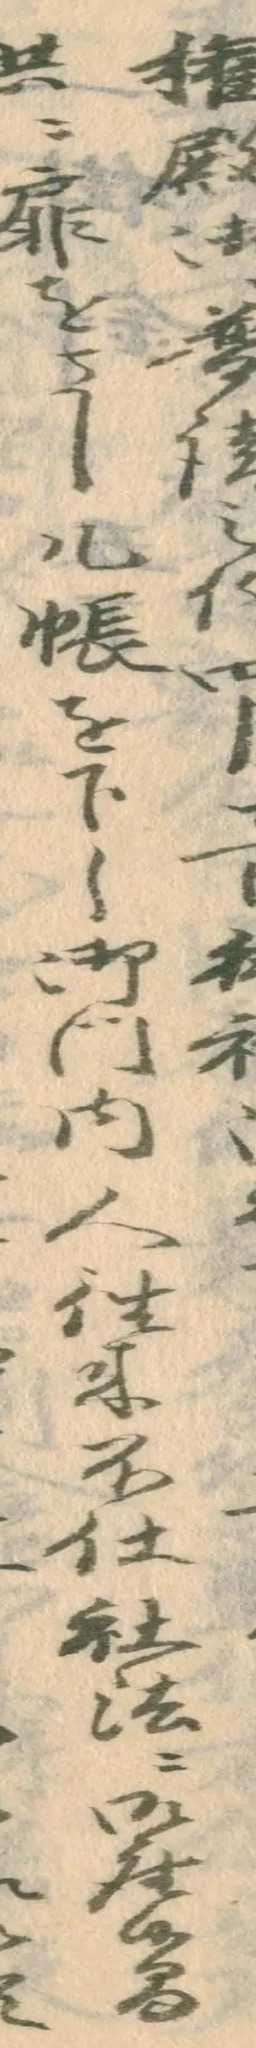共ニ扉をさし几帳を下し御門内人往来不仕社法ニ御座候間
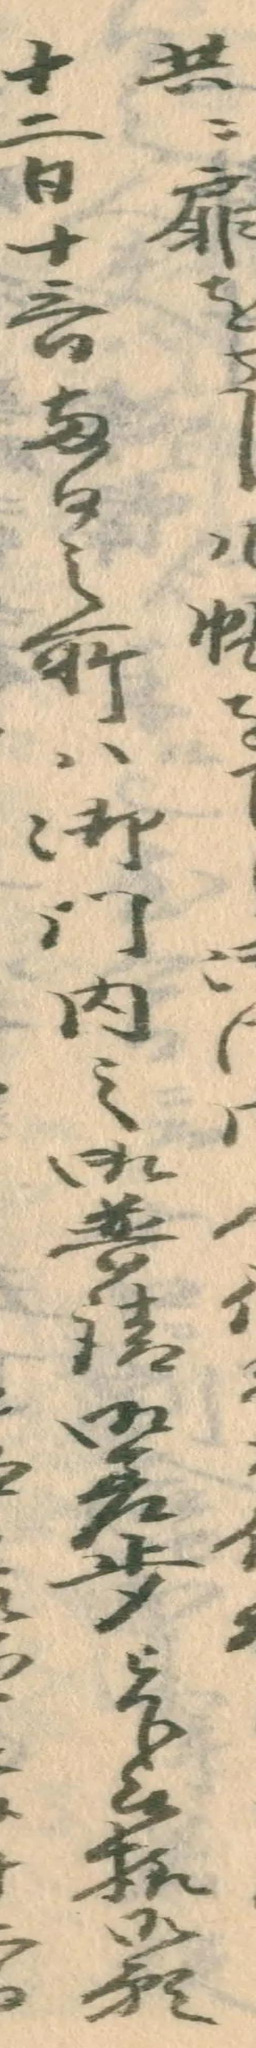十二日十三日両日之所ハ御門内之御普請御差止メ被下候様御願
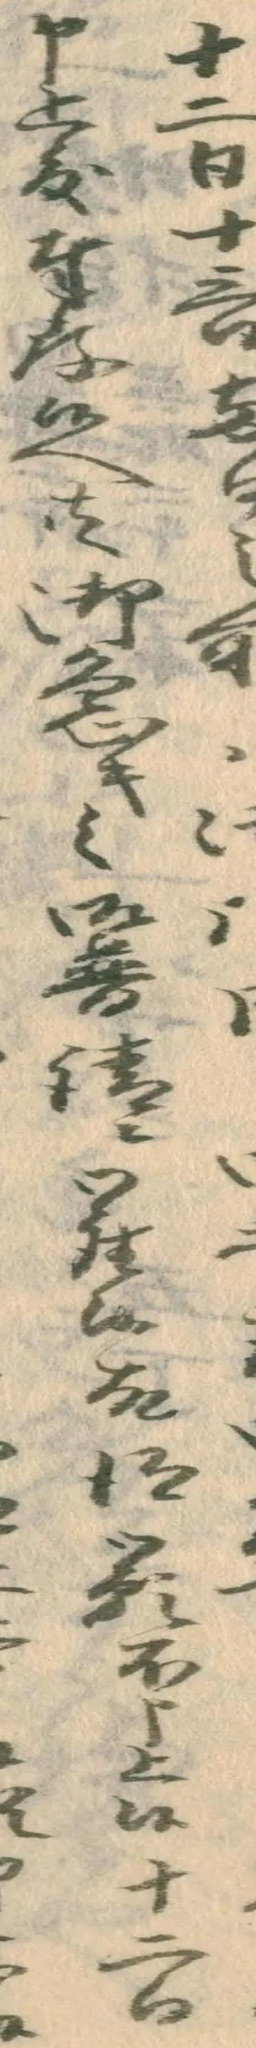申上度奉存候へ共御急キ之御普請ニ御座候故得御願不申上候十二日
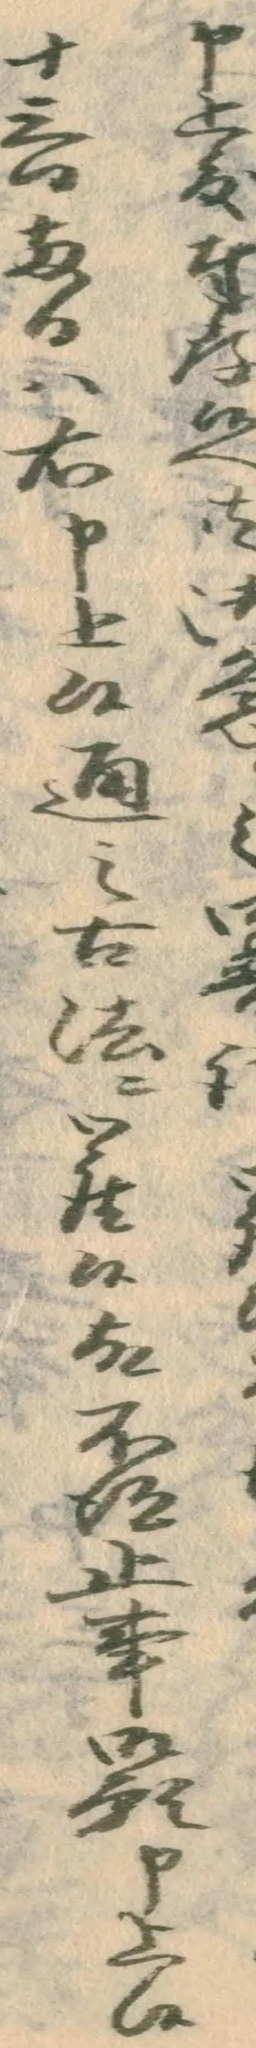十三日両日ハ右申上候通之古法ニ御座候故不得止事御願申上候
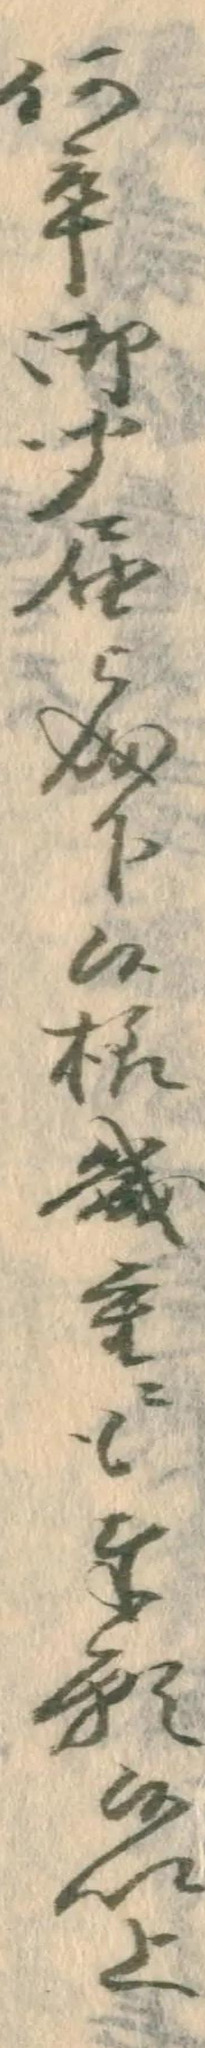何卒御聞届被成下候様幾重ニも奉願候以上
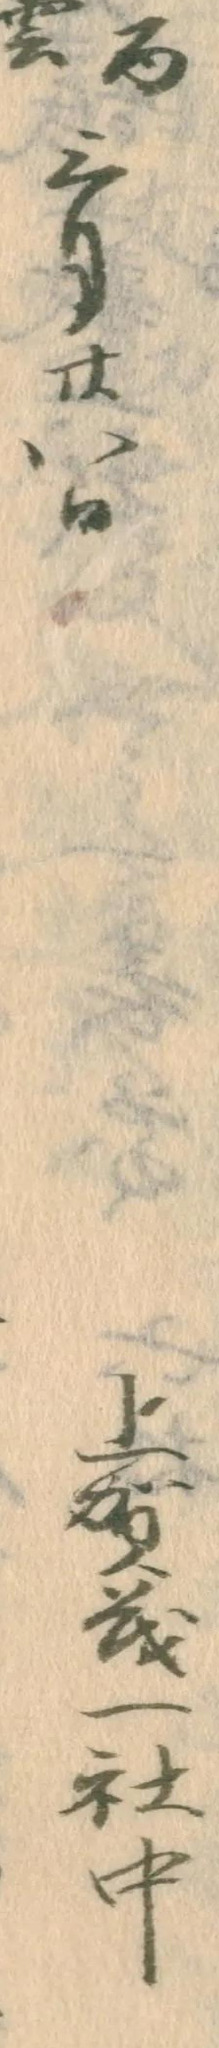酉三月廿八日上賀茂一社中
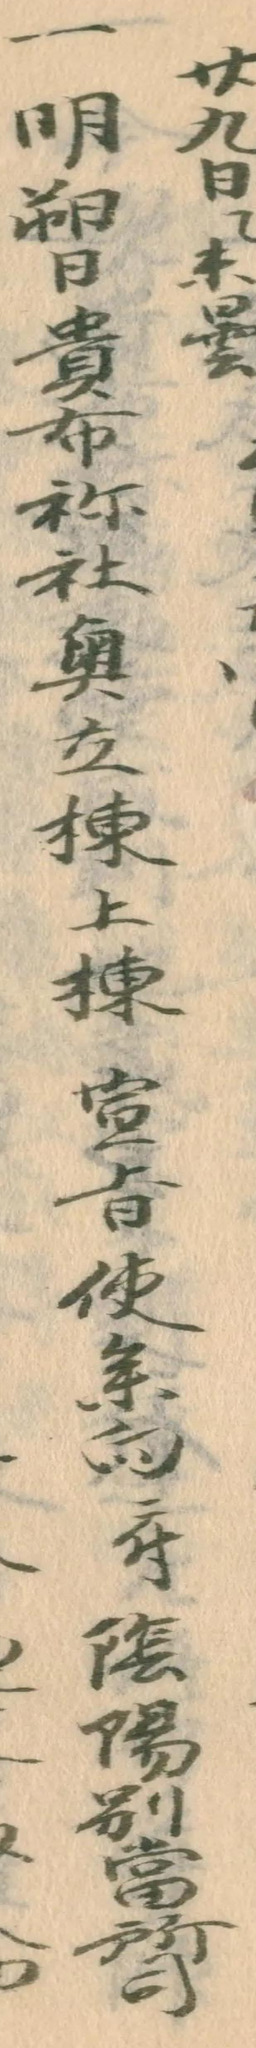一明朔日貴布祢社奥立棟上棟宣旨使参向ニ付陰陽別当所司
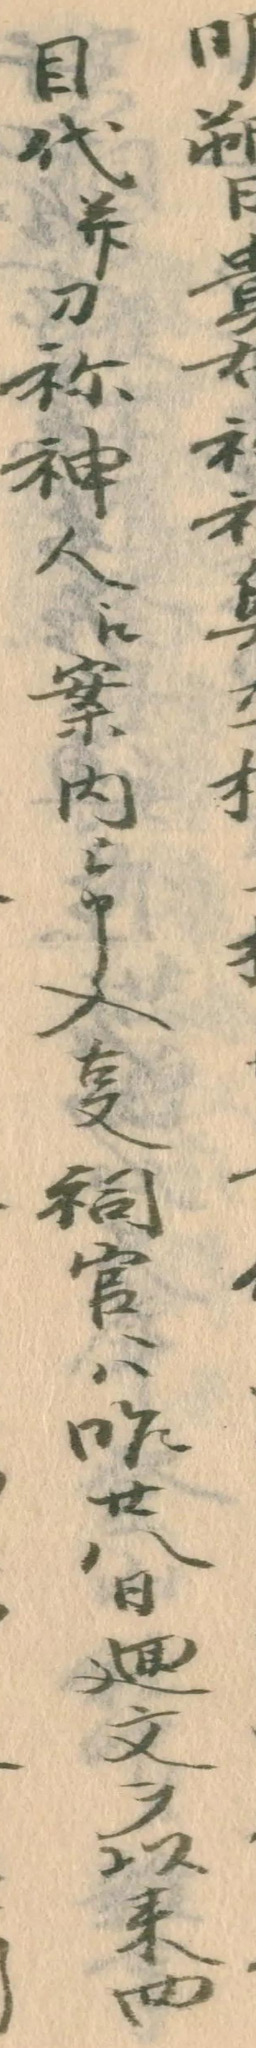目代并刀祢神人江案内被申入事祠官へハ昨廿八日廻文ヲ以来四
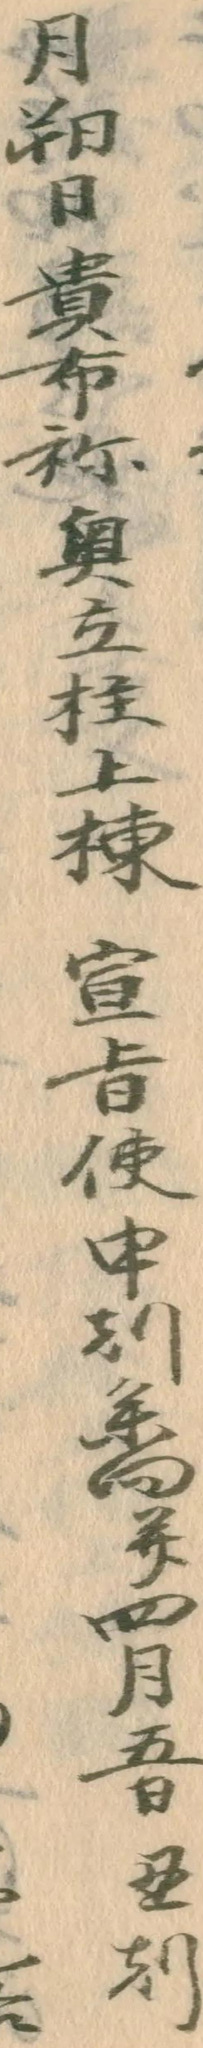月朔日貴布祢奥立柱上棟宣旨使申刻参向并四月五日丑刻
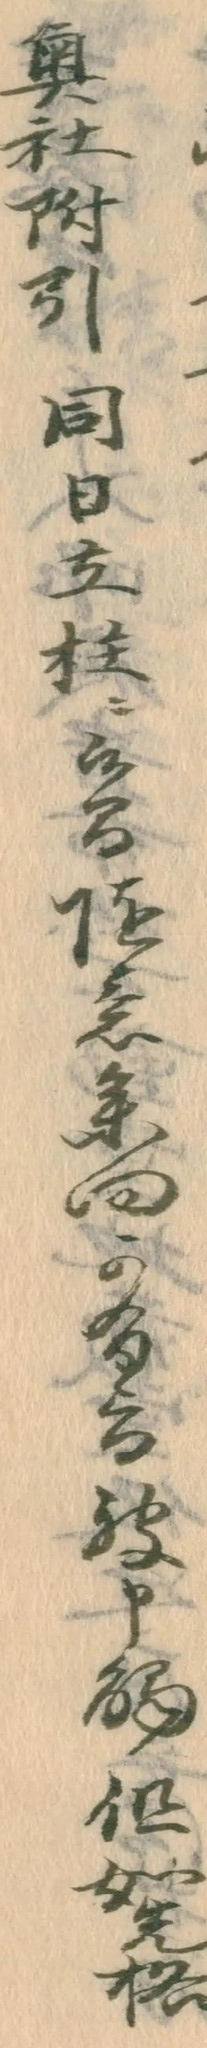奥社附引同日立柱ニ候間随意参向可有旨被申触但如先格
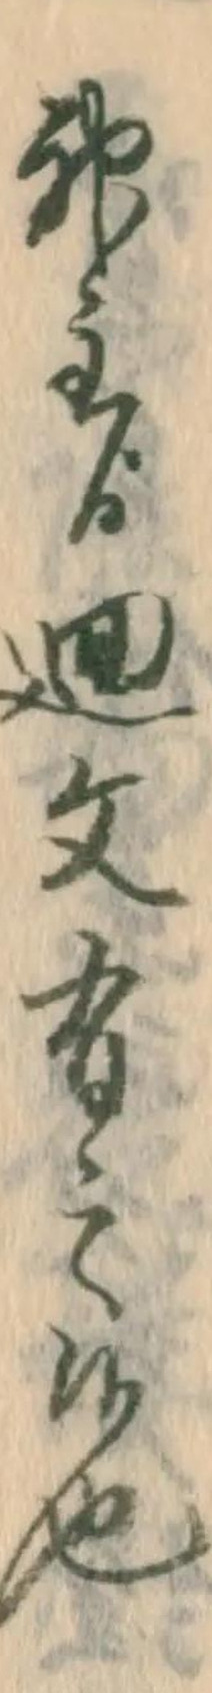神主ゟ廻文有之候也
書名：賀茂社記録. 第17冊
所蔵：国立国会図書館 National Diet Library, JAPAN
